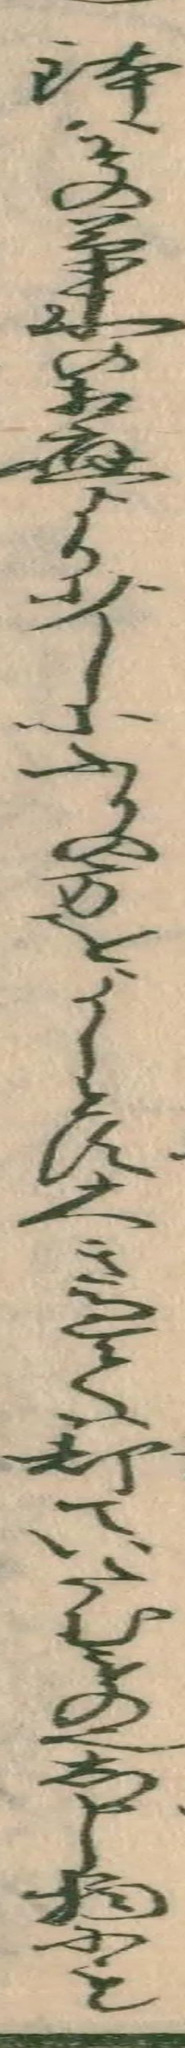○鉢はその草木の相応より少し小ふりの方をよしとす大き過ては却ていたむもの也しかし物にも
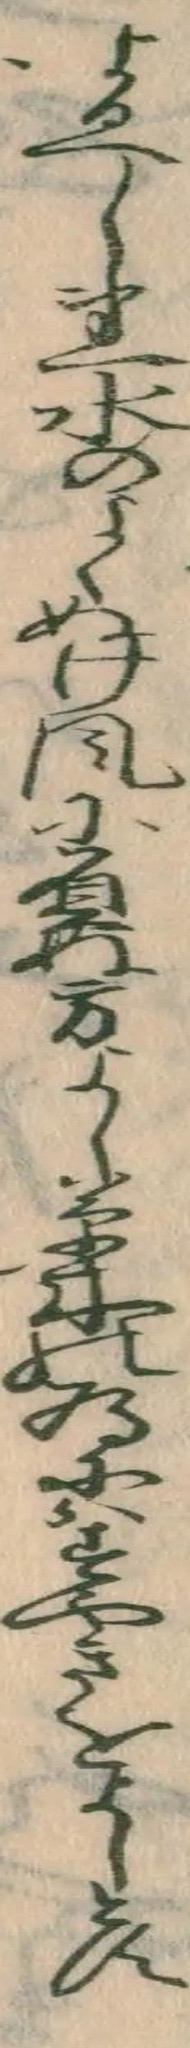よるへし第一水のよくぬけ風に負ぬ方よし草木の為にはすやきをよしとす
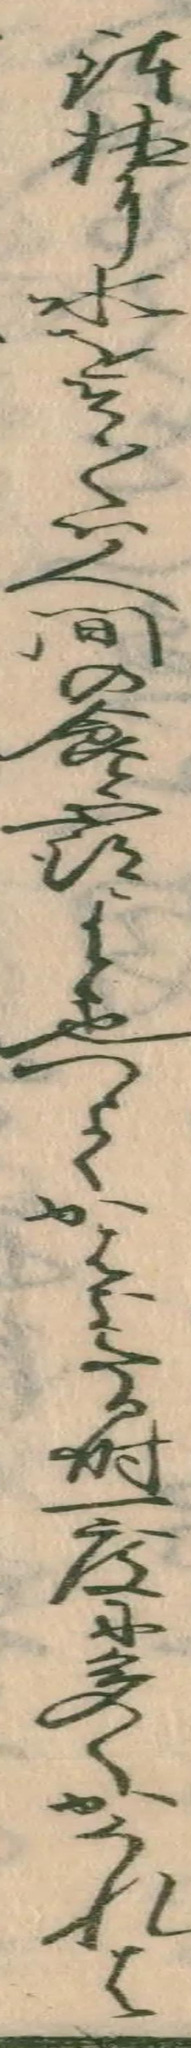○鉢植に水をそゝくは人間の食と心得よと也強くかはきたる時一度に多くかくれは
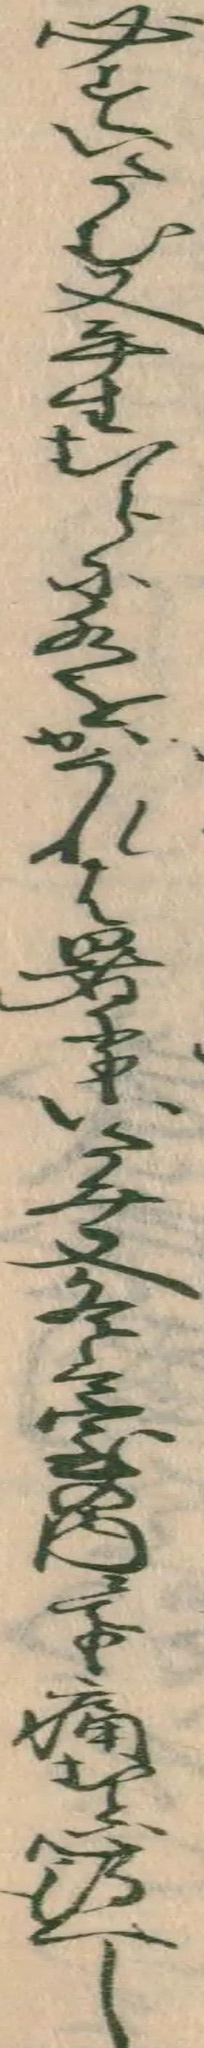必すいたむ又平生むらに水をかくれは暑にもいたみ又冬は室の内にても痛むと心得へし
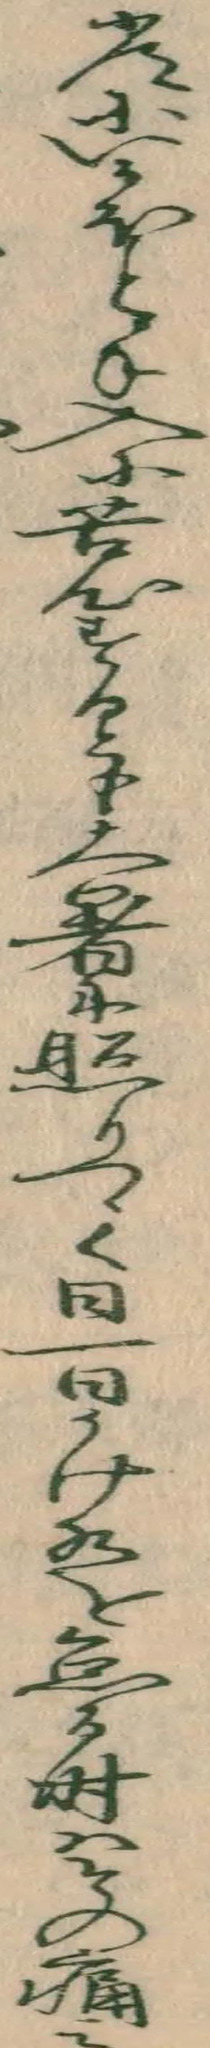○常にいかほと手入に苦心するとも大暑に照りつく日一日かけ水を怠る時はその痛み
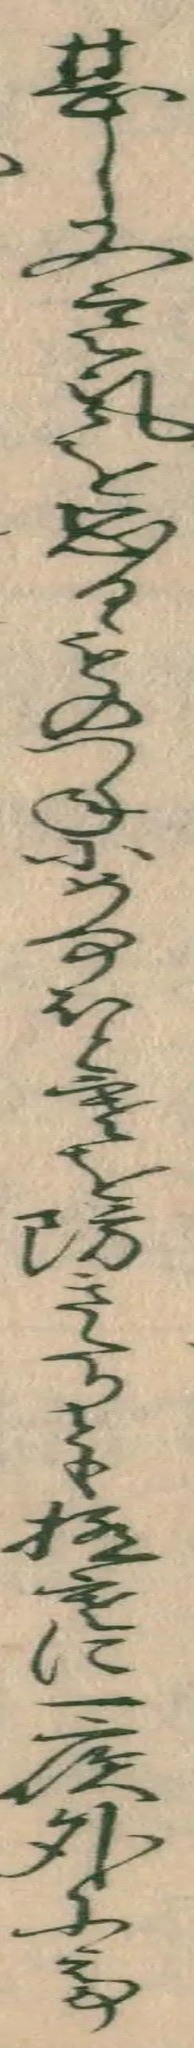甚し又寒気を恐るゝものつねに如何ほと寒を防きたりとも極寒に一夜外にて
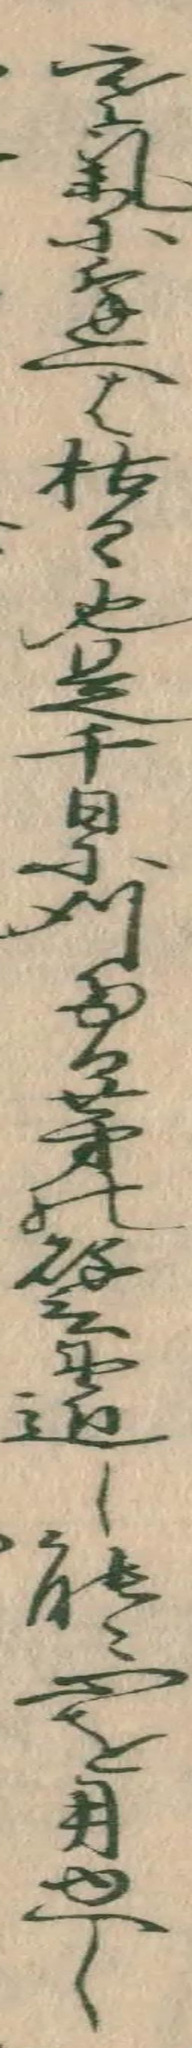寒気に逢へは枯るゝ也是千日に刈たる茅の譬に近し能々心を用ゆへし
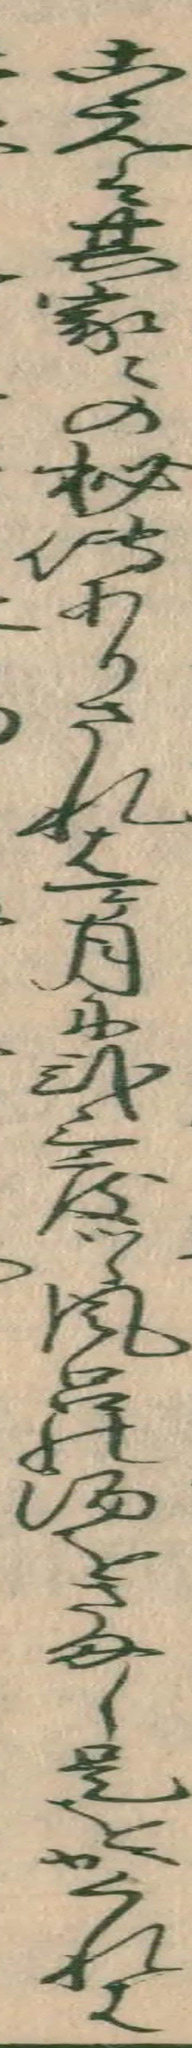○こえは其家々の秘伝ありされは一ケ月に弐三度つゝ風呂の湯をさましこれをかくれは
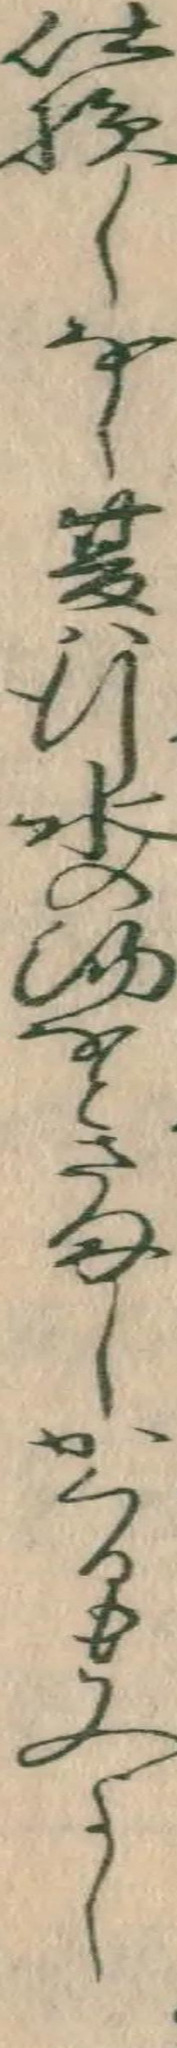仕損しなし夏は行水の湯なとさましかくるも又よし
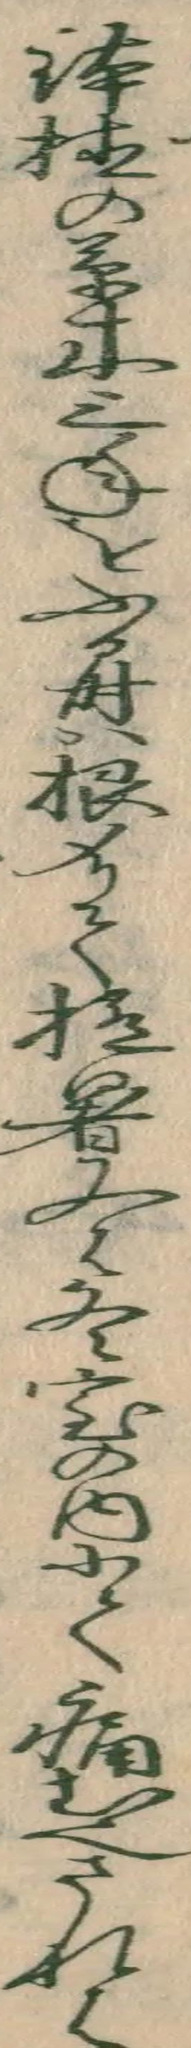○鉢植の草木三年をふる時は根〆りて極暑又は冬室の内にて痛む也されは
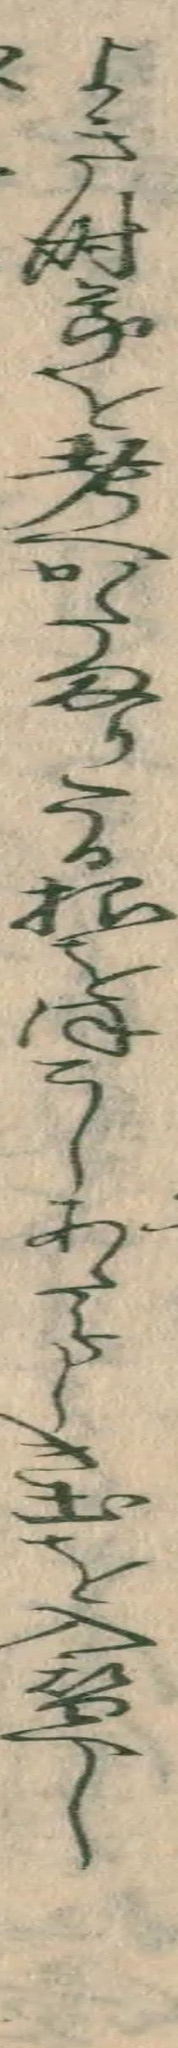よき時節を考へかたまりたる根をほこしあたらしき土を入替へし
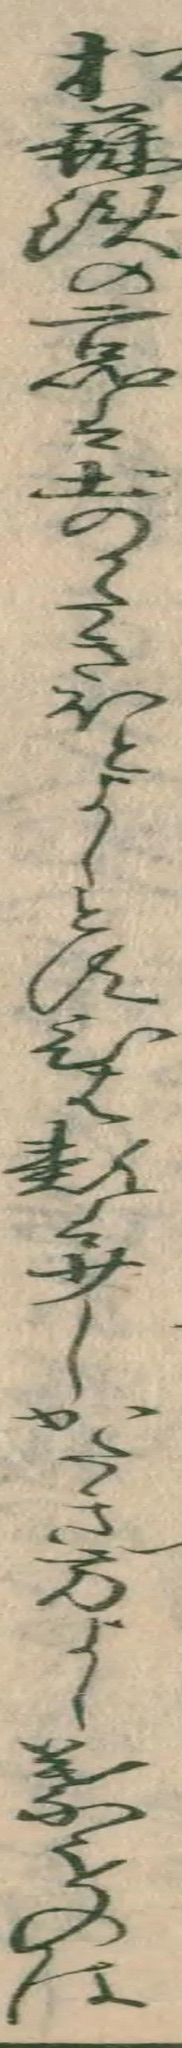○松蘇鉄の二品は土のかたきほとよしとすひは類は少しかたき方よし葉ものは
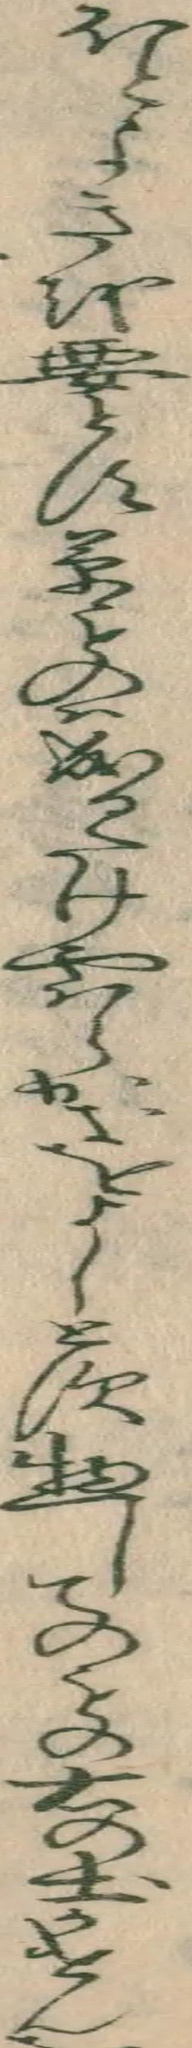ほとよきを要とす草ものは成るたけやはらかきをよしとす惣してのもの右の土かけんを
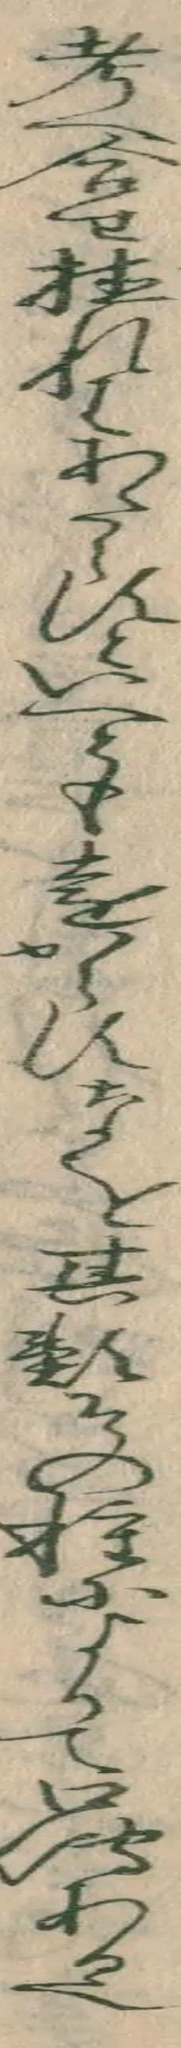考へ合せ植れはあたらすといへとも遠からすなを其類その種によりて口伝ある也
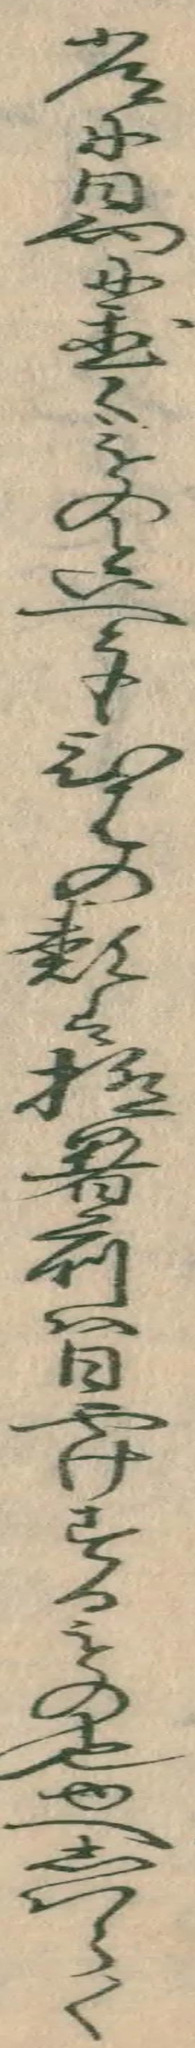○常に日向に置くものといへともひはの類は極暑前は日やけするもの也ゆへしはらく
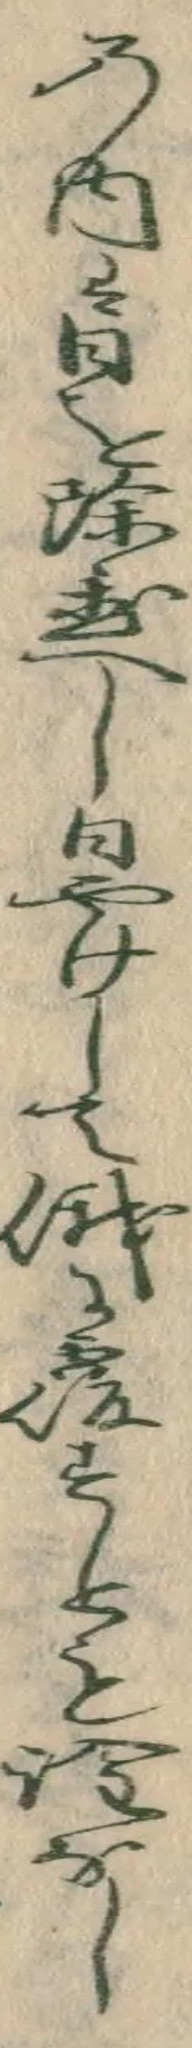の内は日を除置へし日やけして俄に覆すとも詮なし
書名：草木奇品家雅見 3巻. [3]
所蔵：国立国会図書館 National Diet Library, JAPAN
